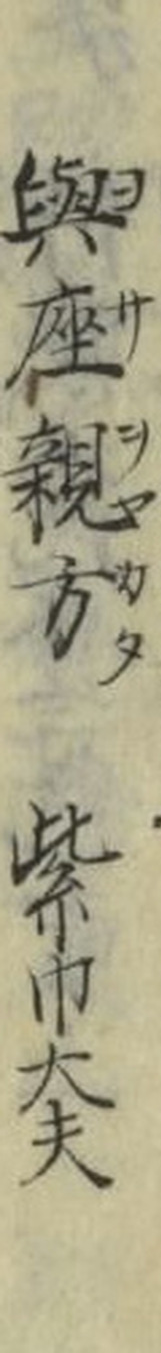副使与座親方紫巾大夫
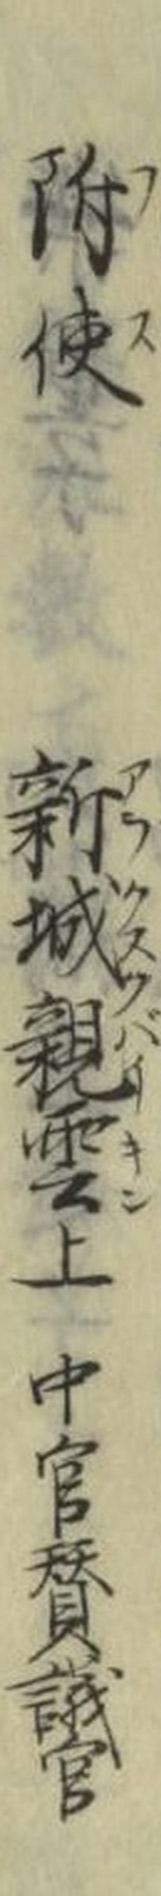附使新城親雲上中官賛議官
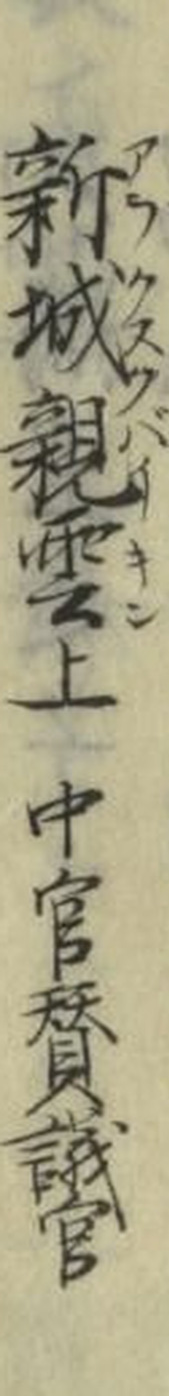附使新城親雲上中官賛議官
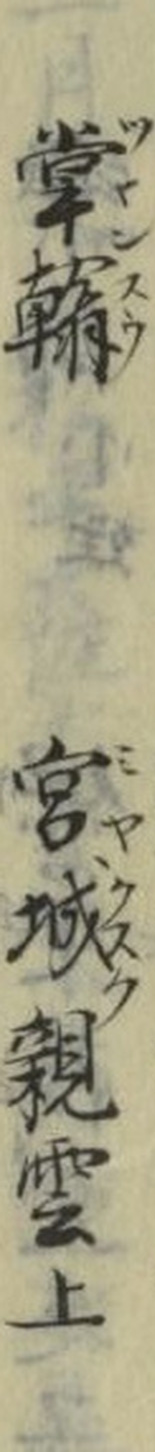掌翰宮城親雲上
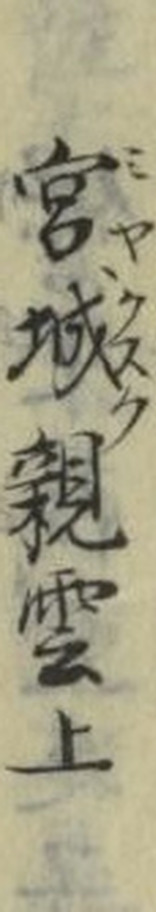掌翰宮城親雲上
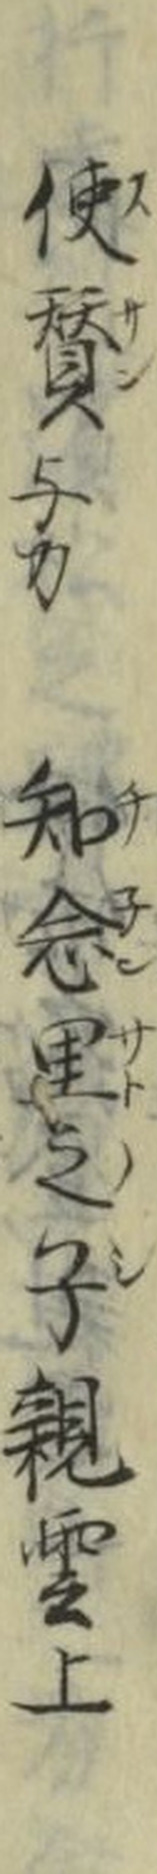使賛与力知念里之子親雲上
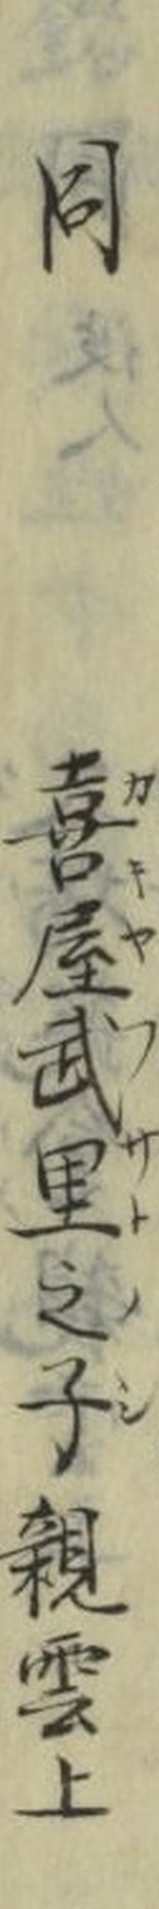同喜屋武里之子親雲上
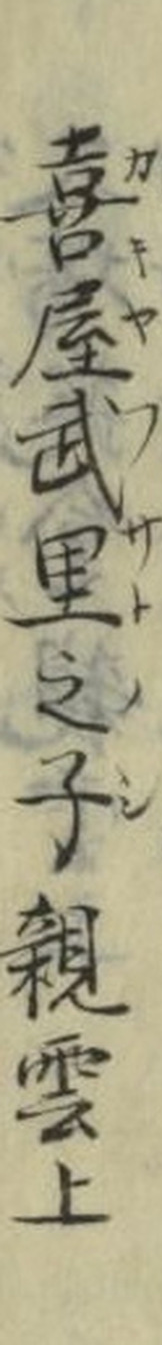同喜屋武里之子親雲上

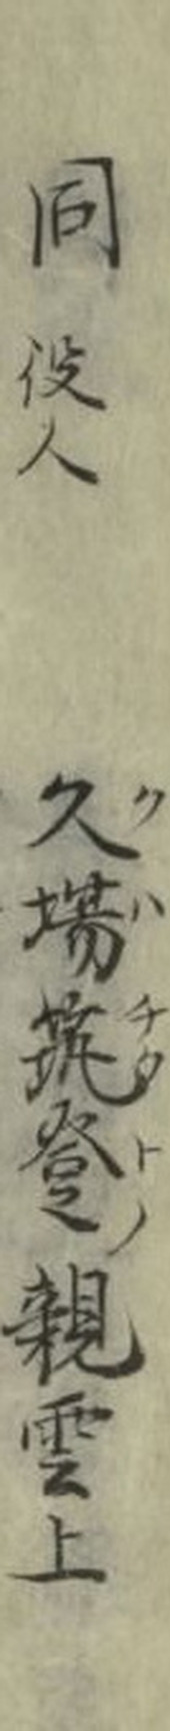同役人久場筑登親雲上
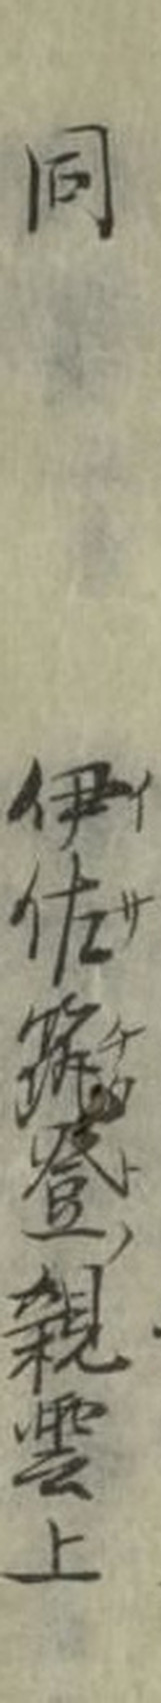同伊佐筑登親雲上
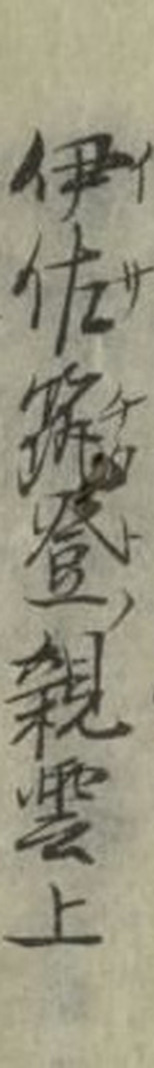同伊佐筑登親雲上
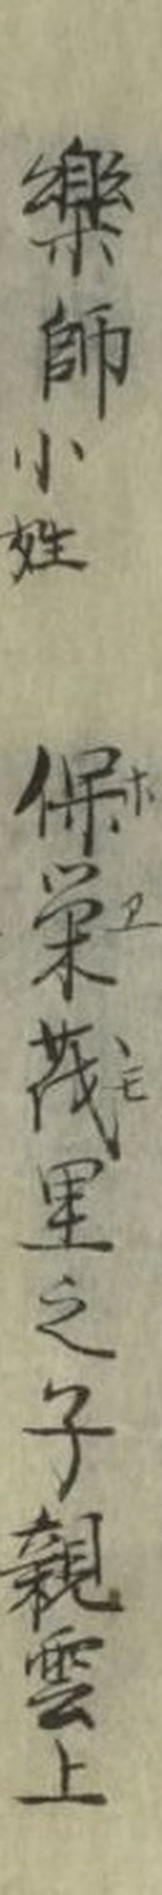楽師小姓保栄茂里之子親雲上
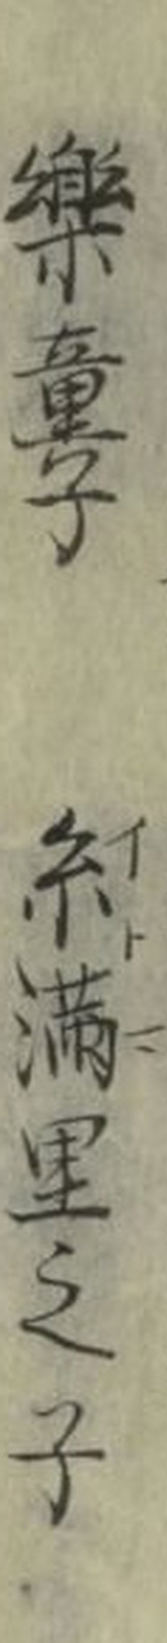楽童子糸満里之子
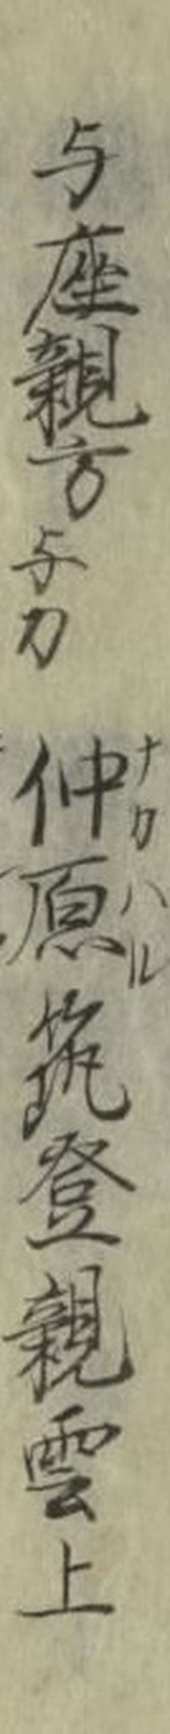与座親方与力仲原筑登親雲上
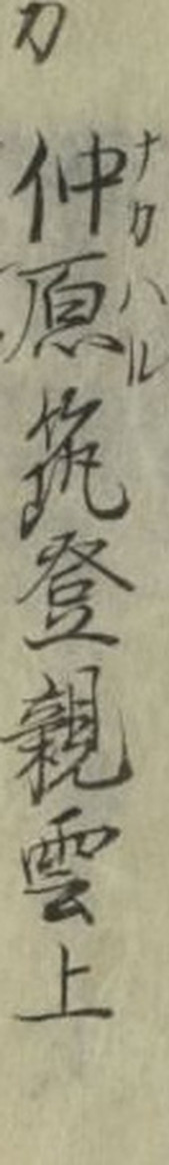同伊佐筑登親雲上
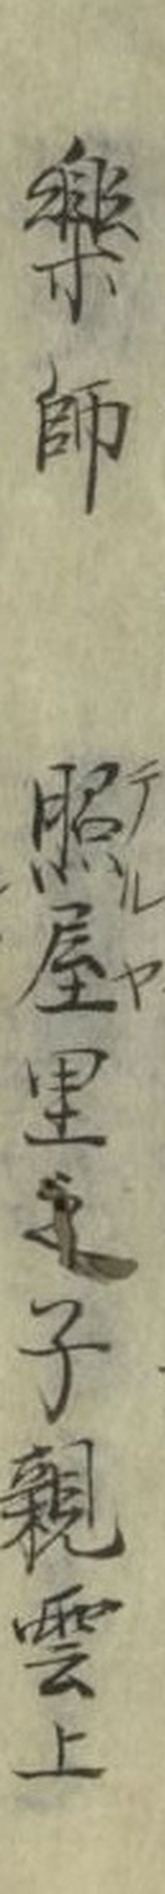楽師照屋里之子親雲上
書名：宝永七庚寅年琉球国来聘使日記
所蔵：University of the Ryukyus Library
